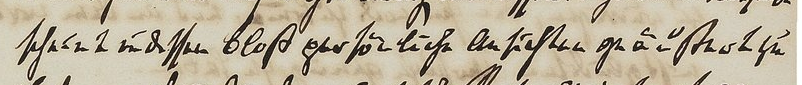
scheint indessen bloß persönliche Ansichten geäußert zu
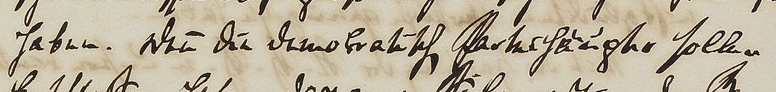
haben. Denn die demokratischen Parteihäupter sollen
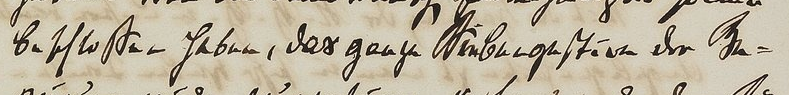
beschloßen haben, das ganze Siebengestirn der Re-
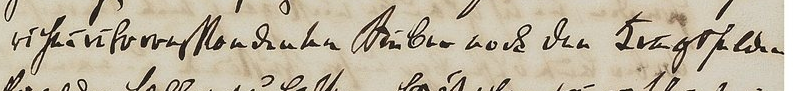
riheiricorrespondenten Sieber noch den Kriegshelden
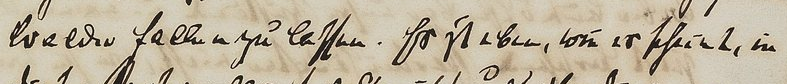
Walder fallen zu lassen. Es ist eben, wie es scheint, in
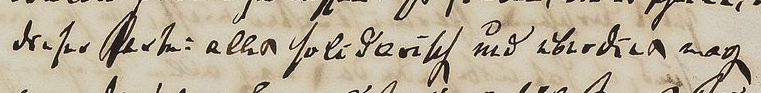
dieser Partei alles solidarisch und überdies mag
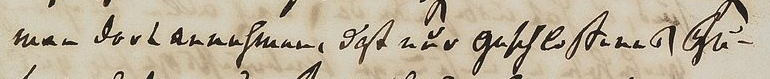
man dort annehmen, daß nur geschloßenes Zu-
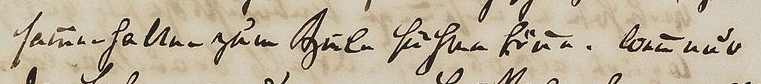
sammenhalten zum Ziele führen könne. Wenn nur
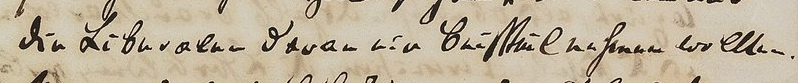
die Liberalen daran ein Beispiel nehmen wollten.
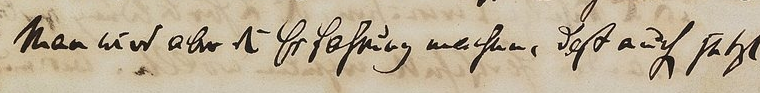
Man wird aber die Erfahrung machen, daß auch jetzt,
